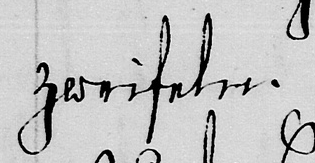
zweifeln.
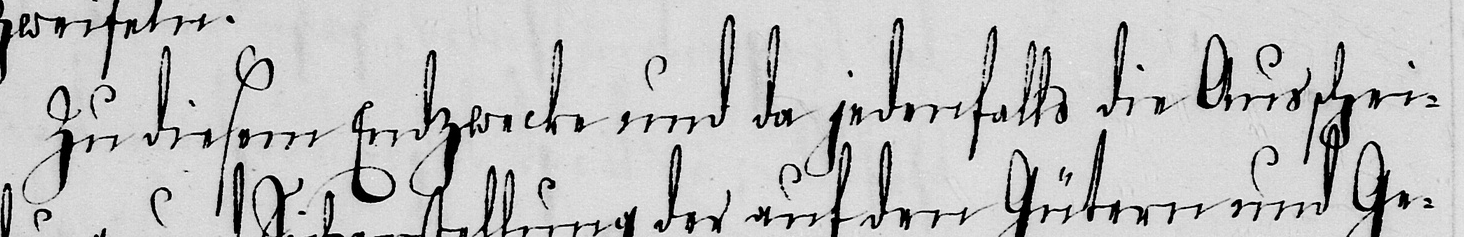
Zu diesem Endzwecke und da jedenfalls die Aussch¬
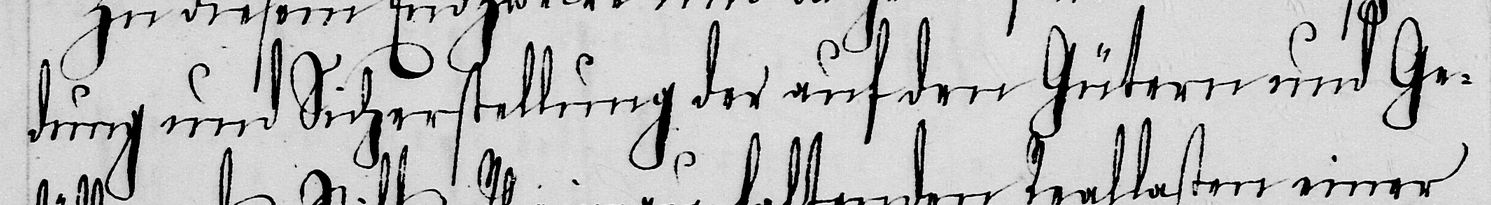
dung und Sicherstellung der auf den Gütern und Ge¬
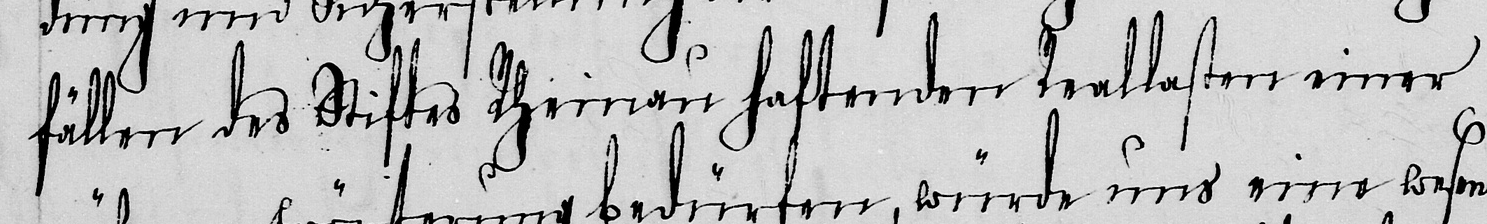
fällen des Stiftes Rheinau haftenden Reallasten einer
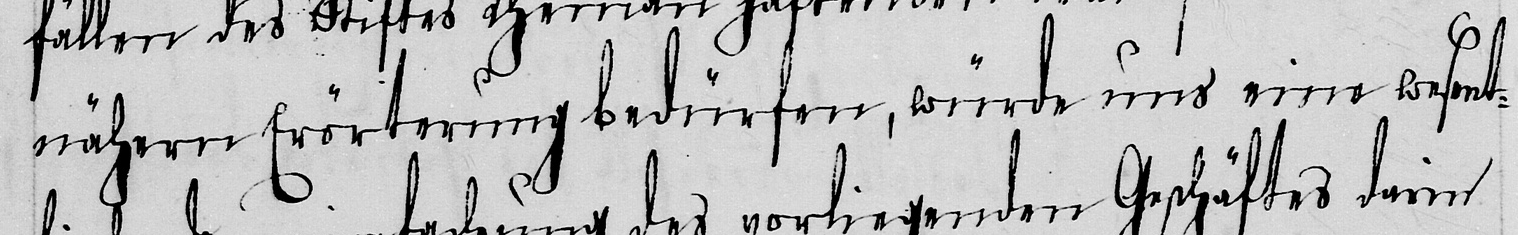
nähern Erörterung bedürfen, würde uns eine wesen¬
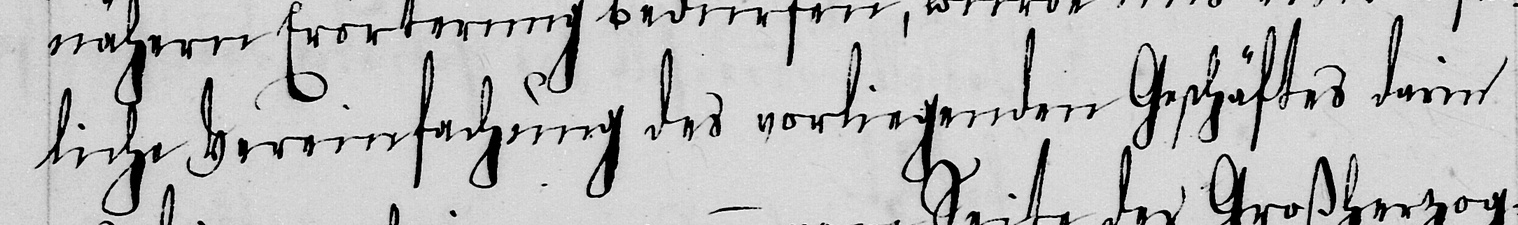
tliche Vereinfachung des vorliegenden Geschäftes darin
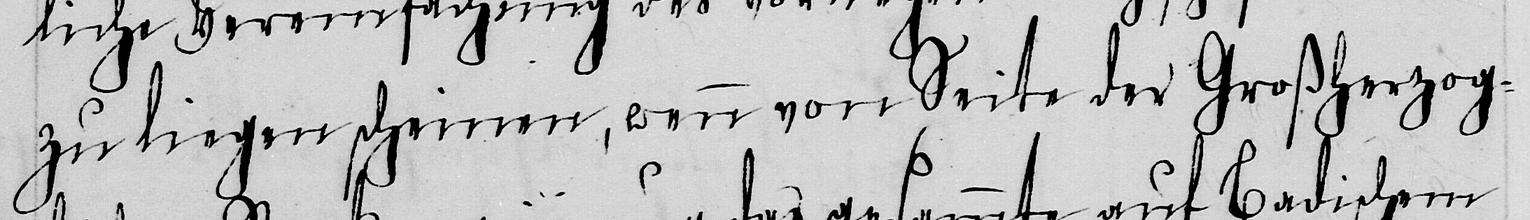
zu liegen scheinen, wenn von Seite der Großherzog¬
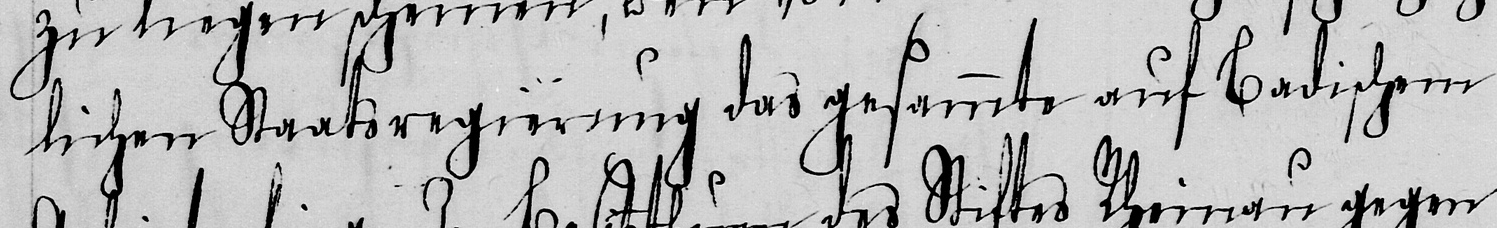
lichen Staatsregierung das gesammte auf Badischem
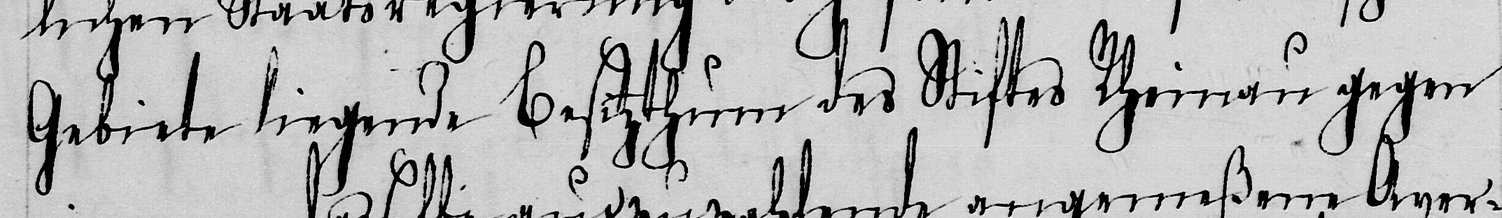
Gebiete liegende Besitzthum des Stiftes Rheinau gegen
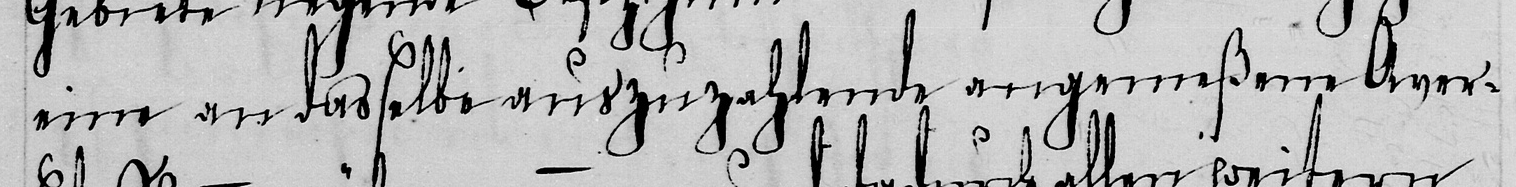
eine an dasselbe auszuzahlende angemeßene Aver¬
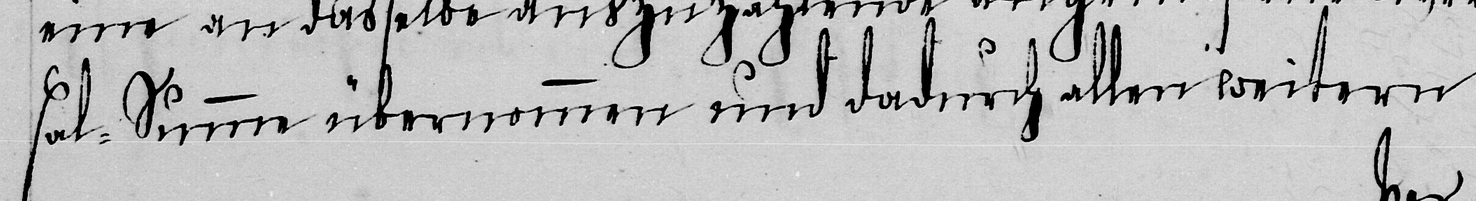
sal-Summe übernommen und dadurch allen weitern
